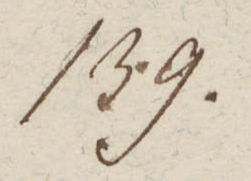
139.
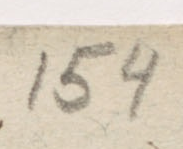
154
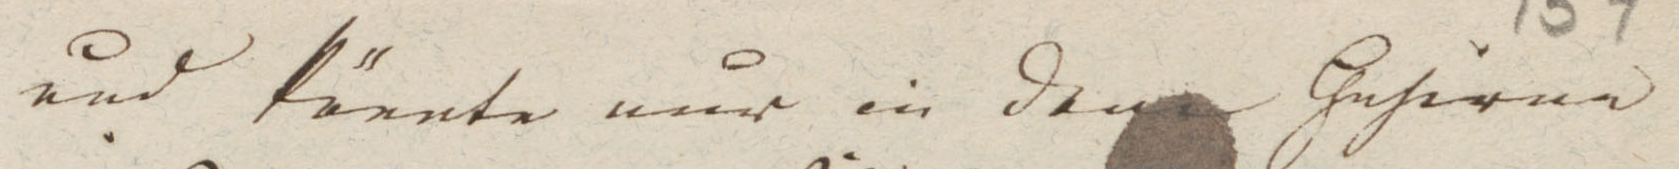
und könnte nur in dem Gehirne
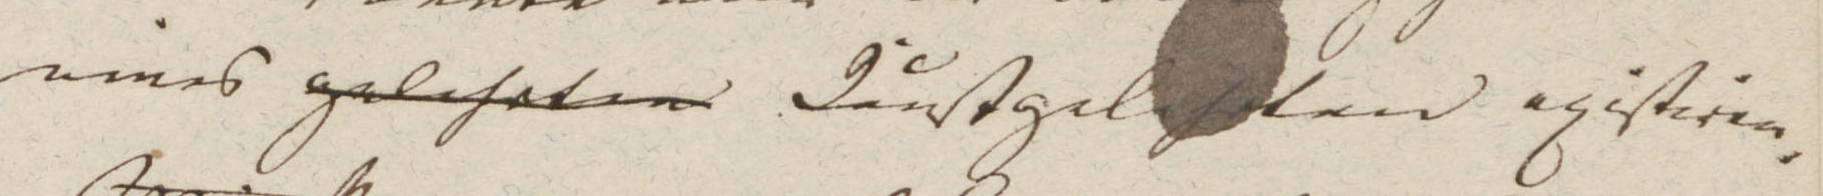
eines gelehrten Kunstgelehrten existiren.
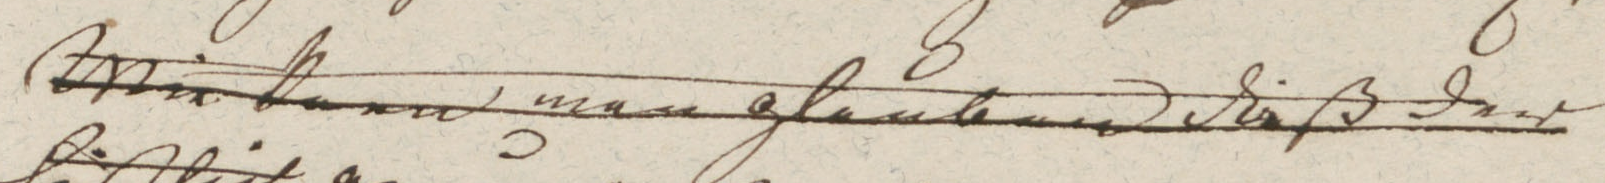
Wie kann man glauben dieass der
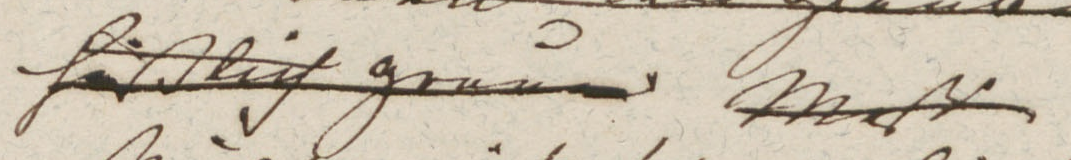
hässlich graue Muss
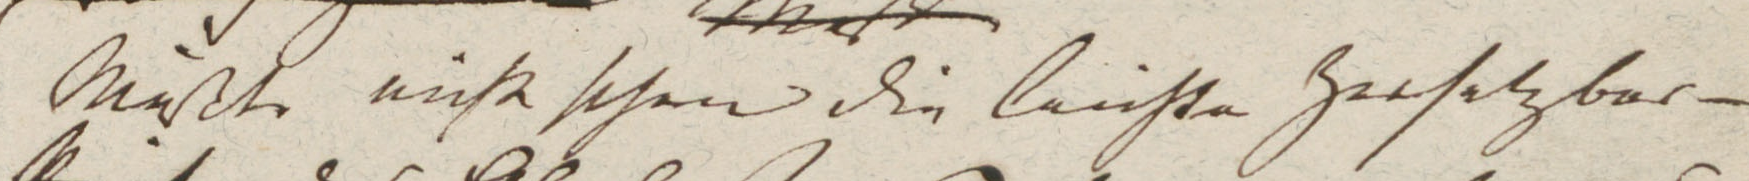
Musste nicht schon die leichte Zersetzbar-
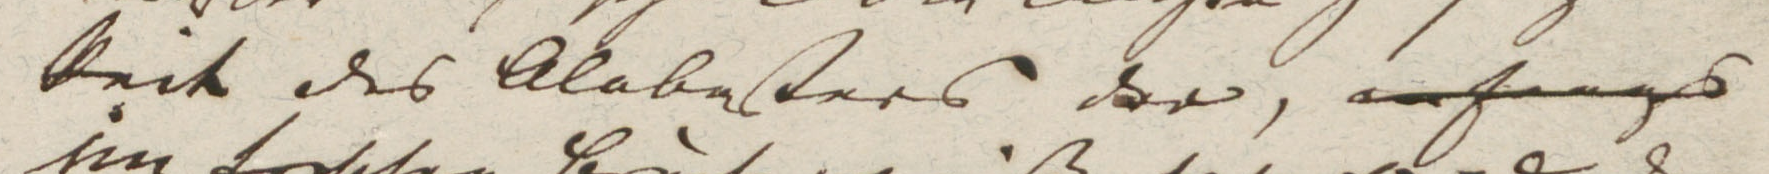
keit des Alabasters der, anfangs
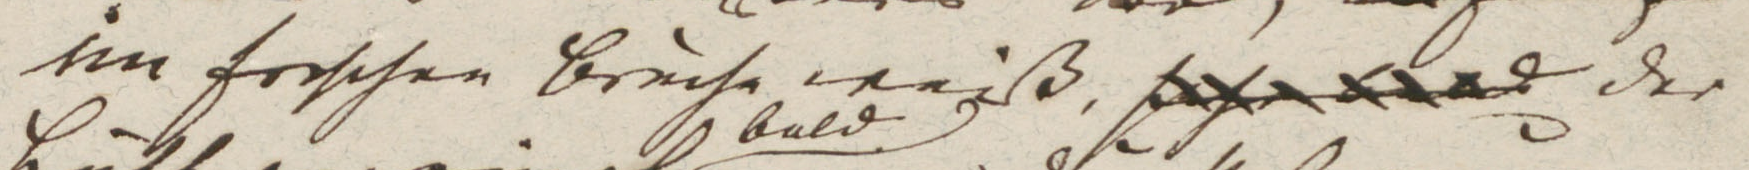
im frischen Bruche weiss, sehr bd der
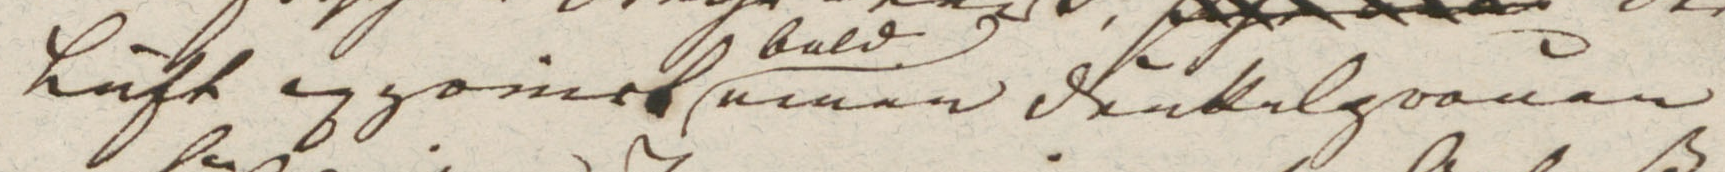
Luft exponirt bald einen dunkelgrauen
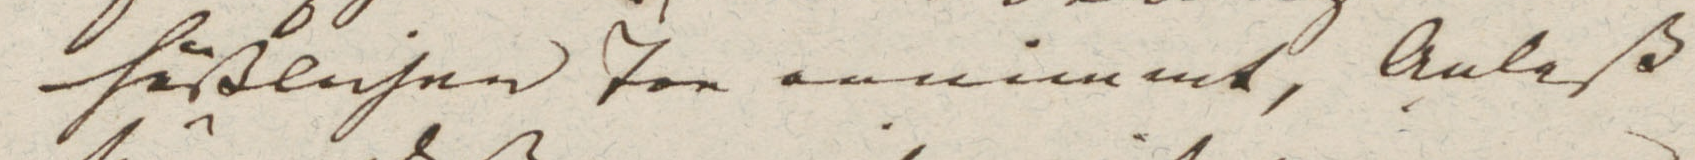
hässlichen Ton einnimmt, Anlass
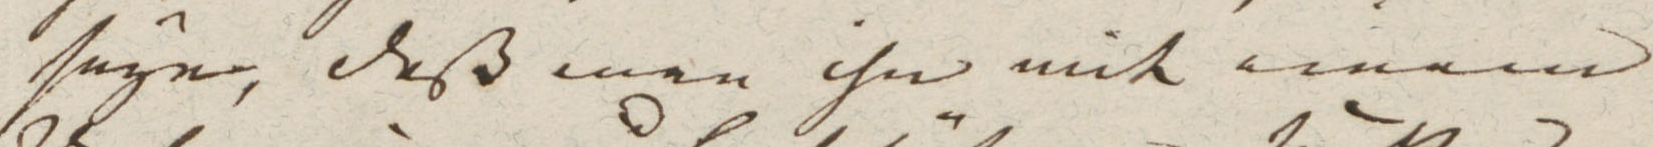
seyn, dass man ihn mit einem
